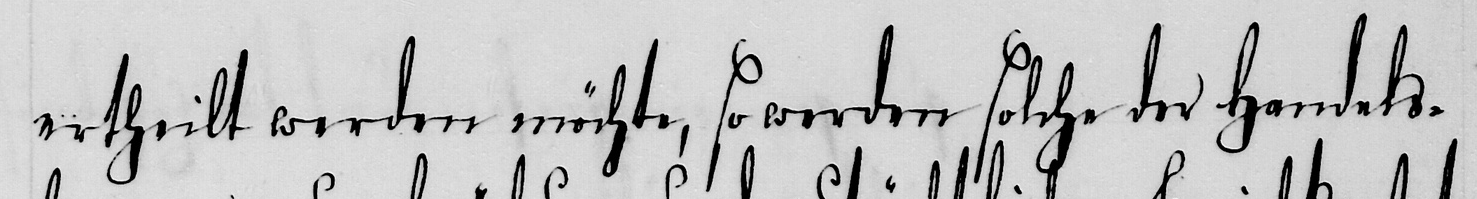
ertheilt werden möchte, so werden solche der Handels¬
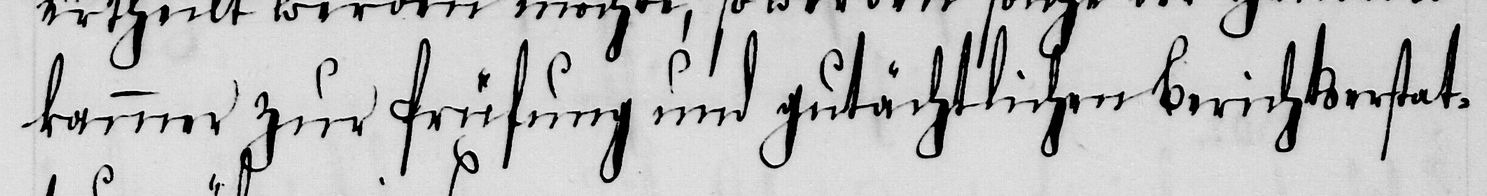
kammer zur Prüfung und gutächtlichen Berichterstat¬
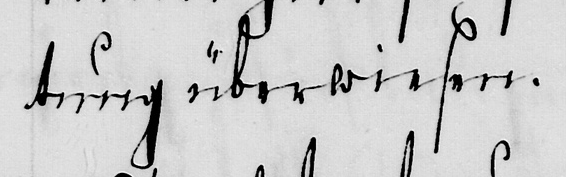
tung überwiesen.
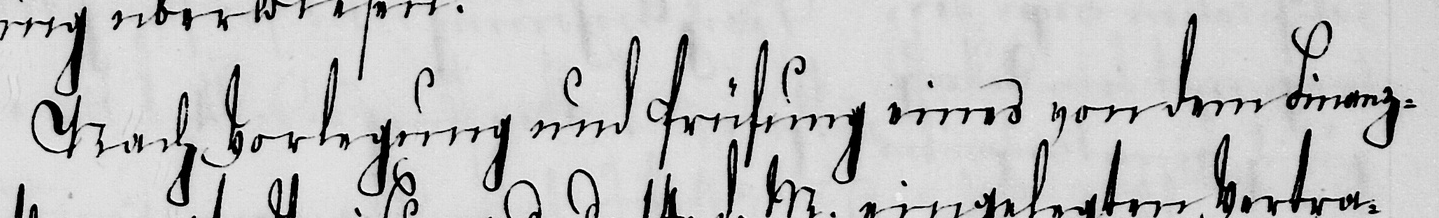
Nach Vorlegung und Prüfung eines von dem Finanz¬
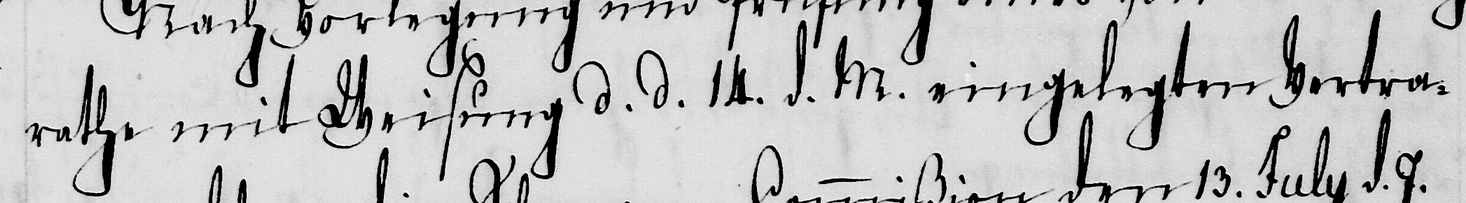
rathe mit Weisung d. d. 14. d. M. eingelegten Vertra¬
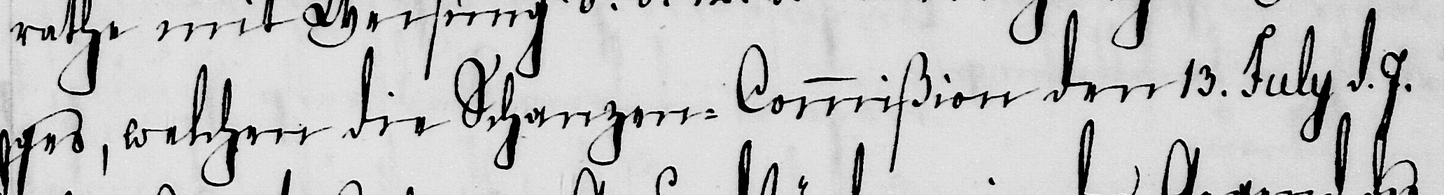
ges, welchen die Schanzen-Commißion den 13. July d. J.
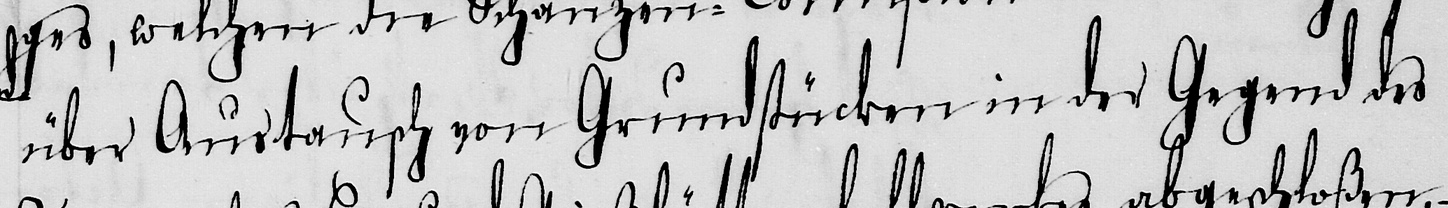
über Austausch von Grundstücken in der Gegend des
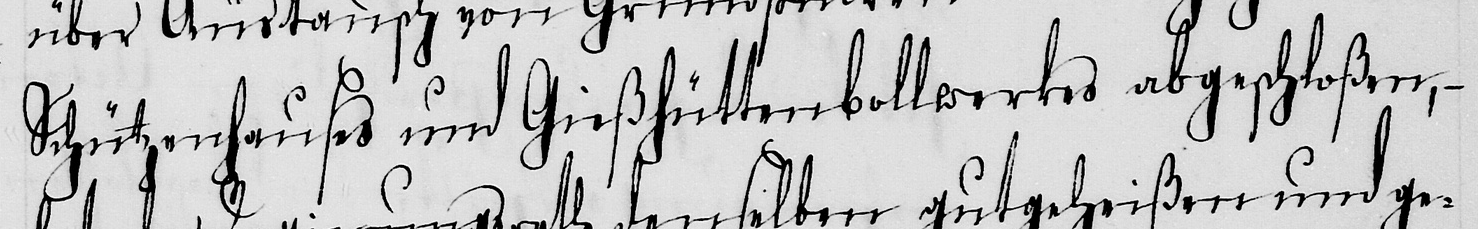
Schützenhauses und Gießhüttenbollwerkes abgeschloßen,
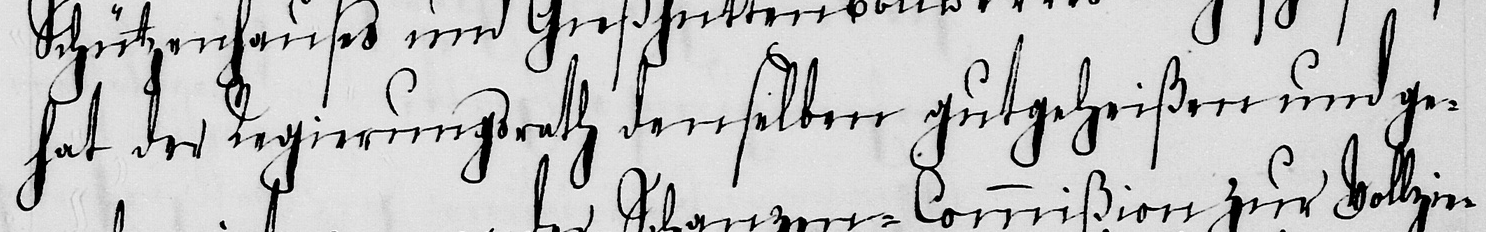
hat der Regierungsrath denselben gutgeheißen und ge¬
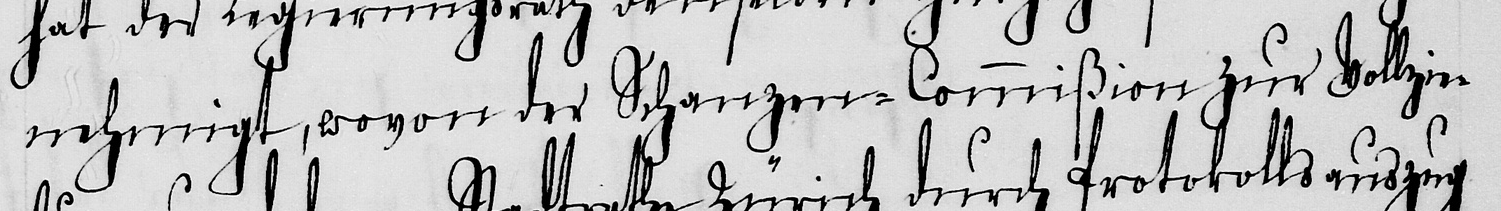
nehmigt, wovon der Schanzen-Commißion zur Vollzie¬
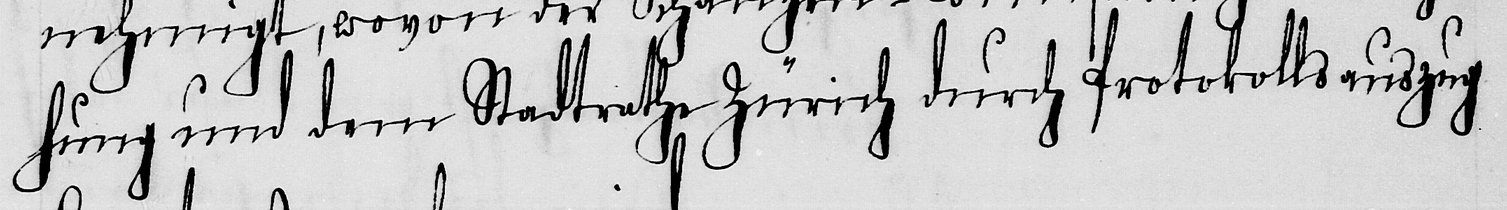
hung und dem Stadtrathe Zürich durch Protokollsauszug
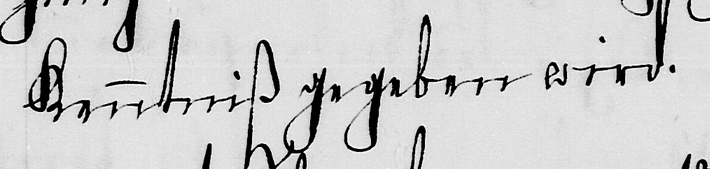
Kenntniß gegeben wird.
